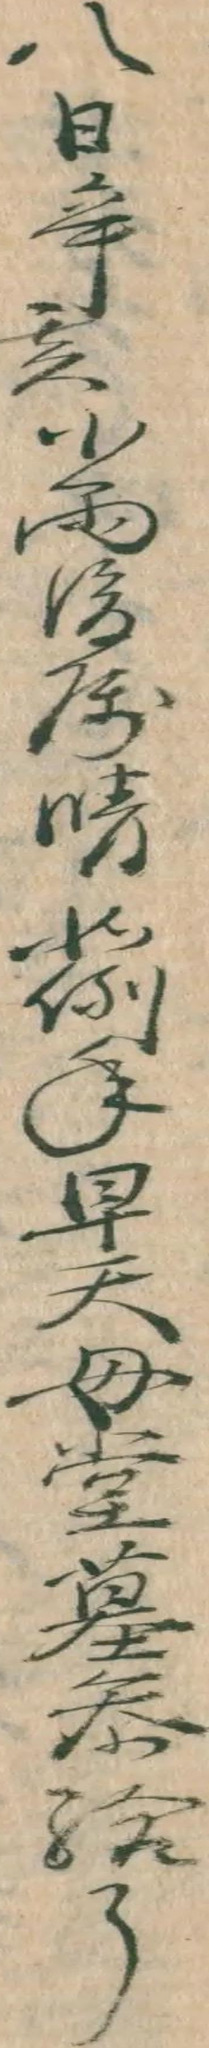八日辛亥小雨後属晴如例年早天母堂墓参給了
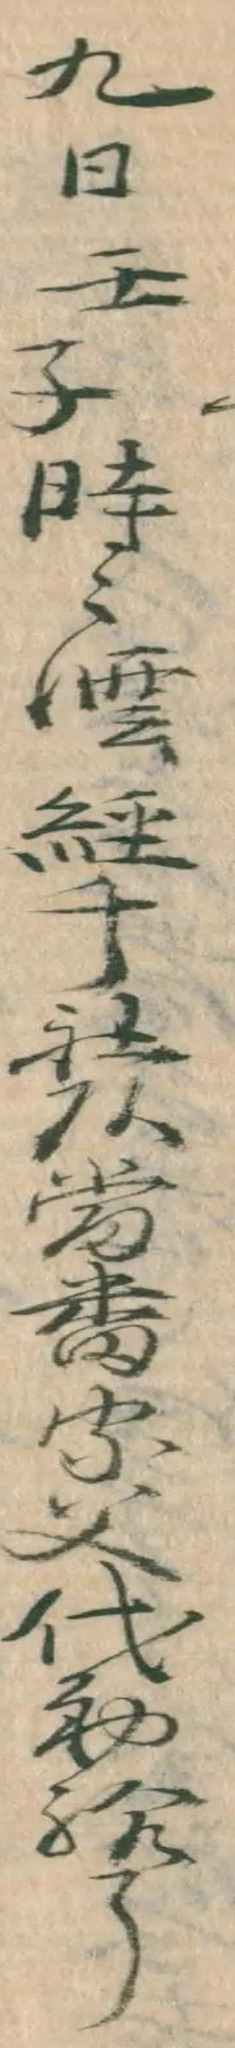九日壬子時々晴經千社頭當番家父代勤給了
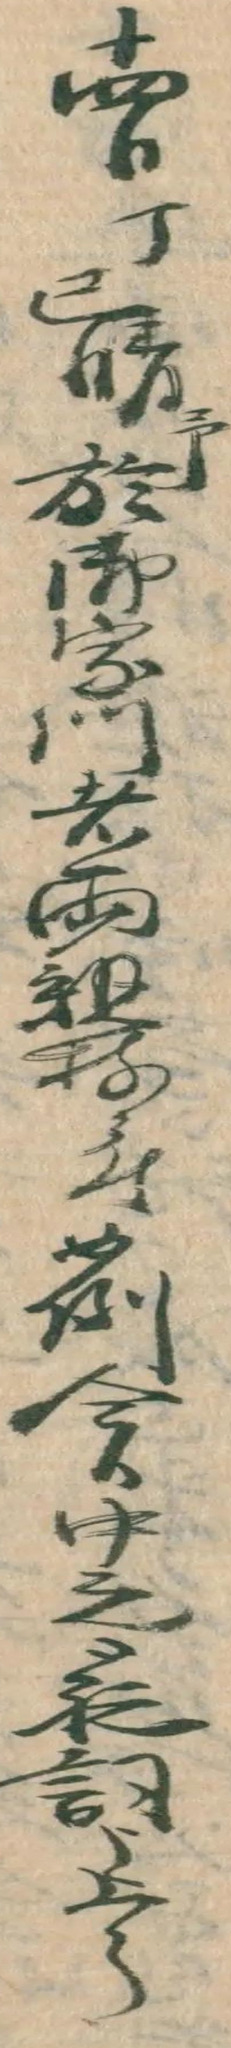十四日丁巳晴予於御家門者両親持ニ付如例合中之御礼詞申上了
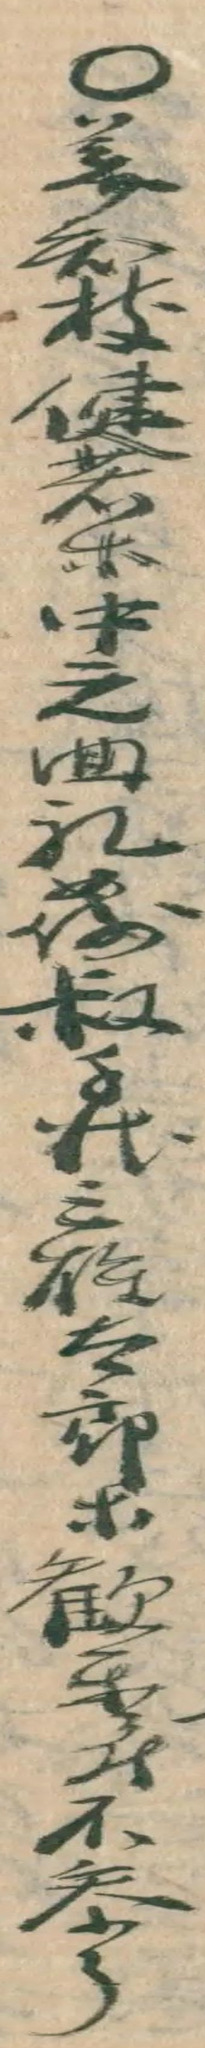○美知枝健若等中元回礼如例叔千代三於太郎等歓楽ニ付不参了
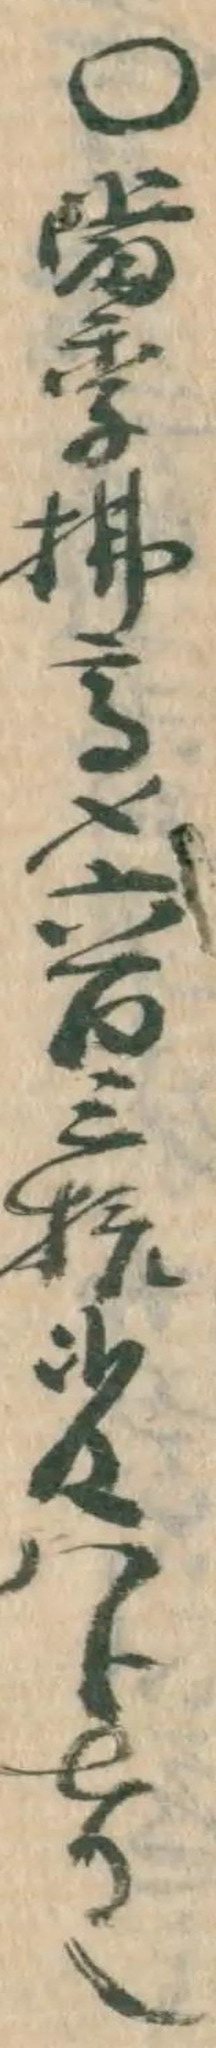○當季払高〆六百三拾弐匁八分七り也
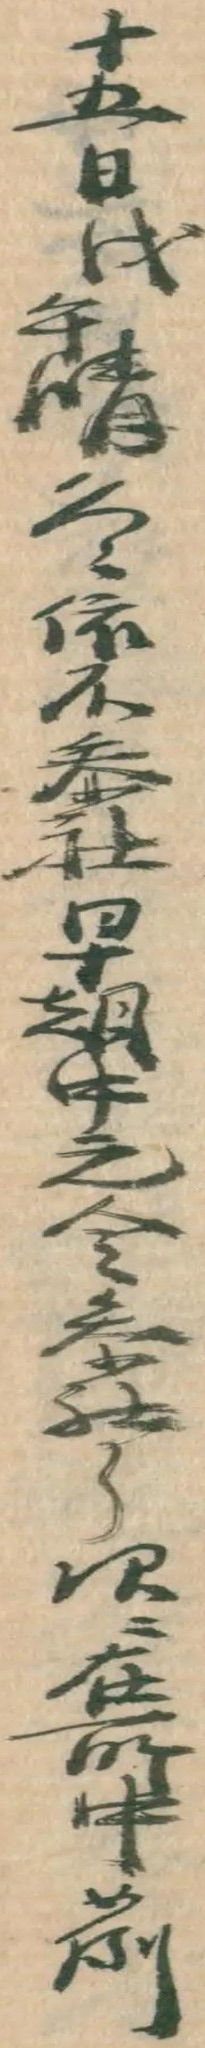十五日戊午晴久々依不参社早朝中元令参了し次ニ在所中如例

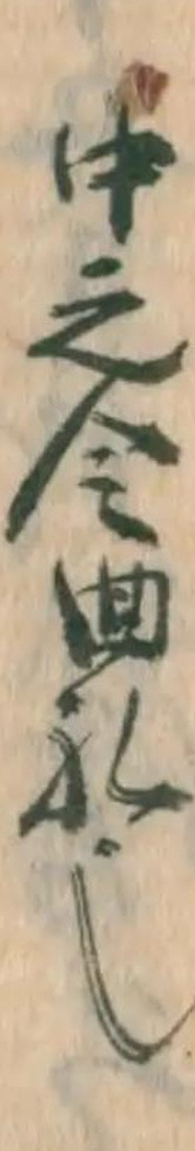中之令回礼也
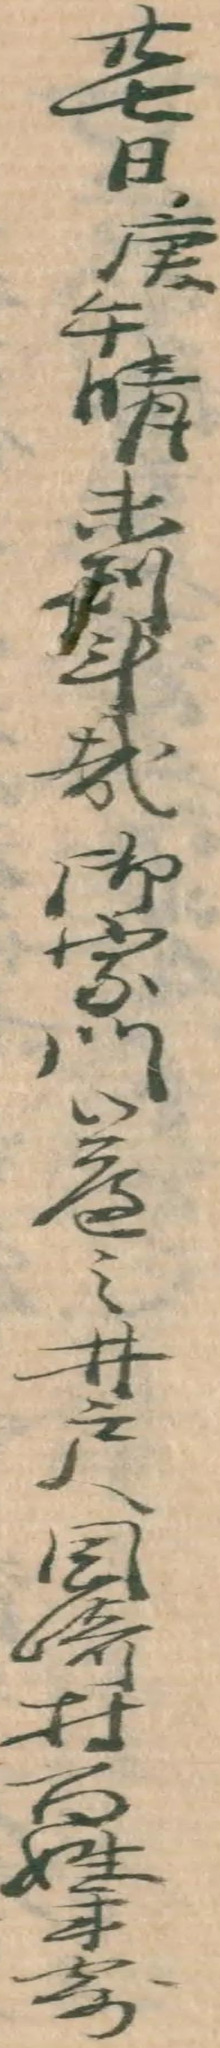廿七日庚午晴未刻斗哉御家門御庭之井戸へ岡崎村百姓年寄
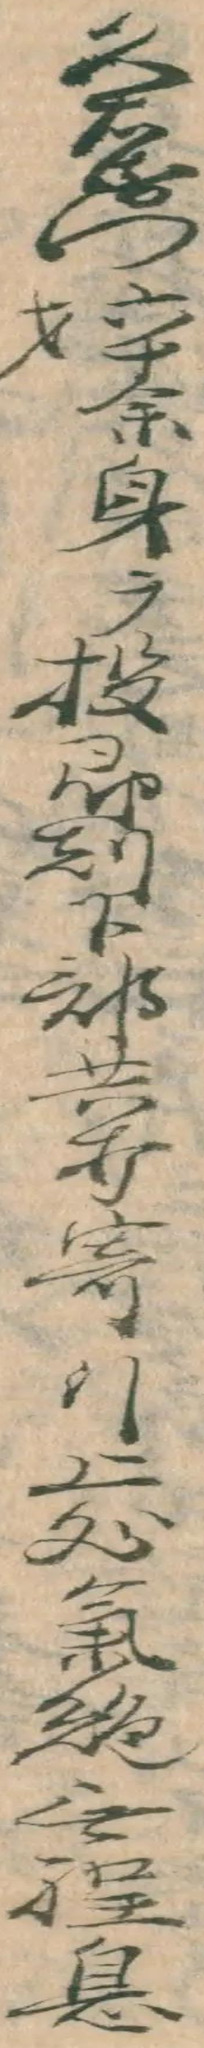久右衛門六十余才身ヲ投即刻下部共打寄引上処気絶無程息
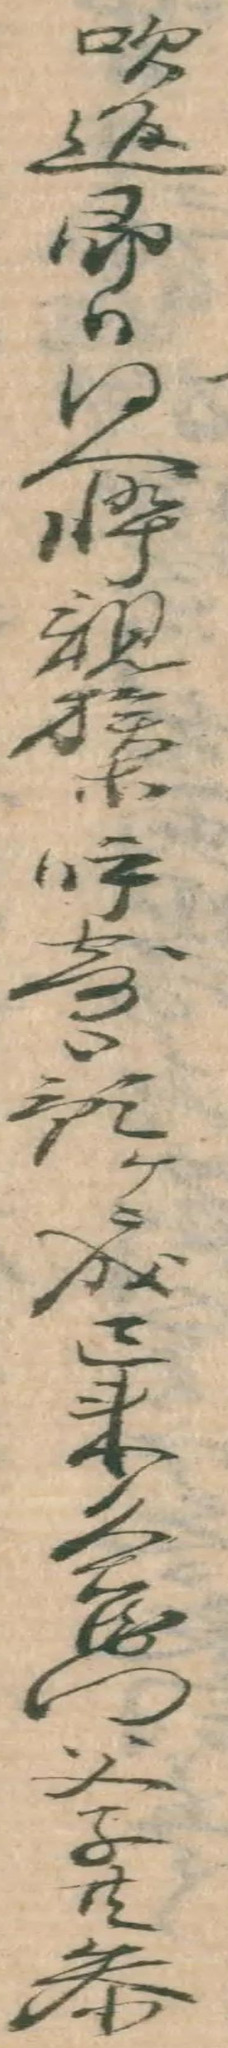吹返即日同人忰親族小呼寄御預ケニ成已来久右衛門父子共参
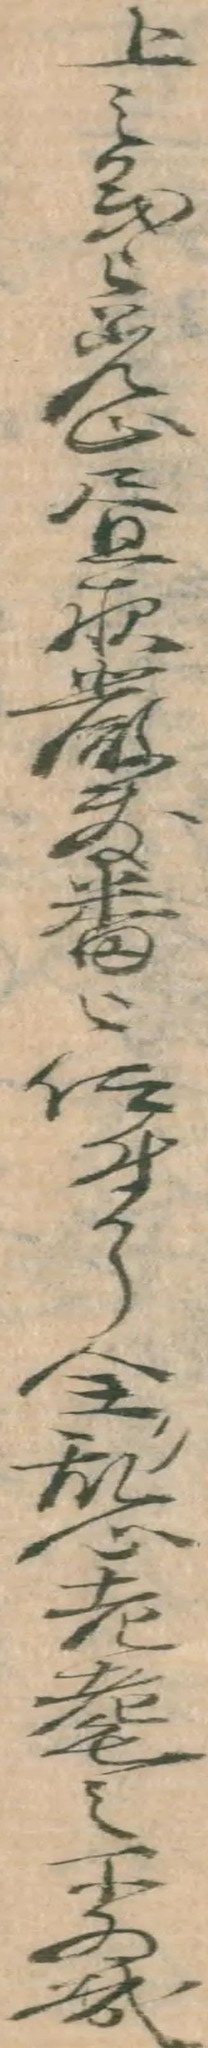上之義被差止昼夜厳敷番被仰付了全ク乱心老耄之品為哉
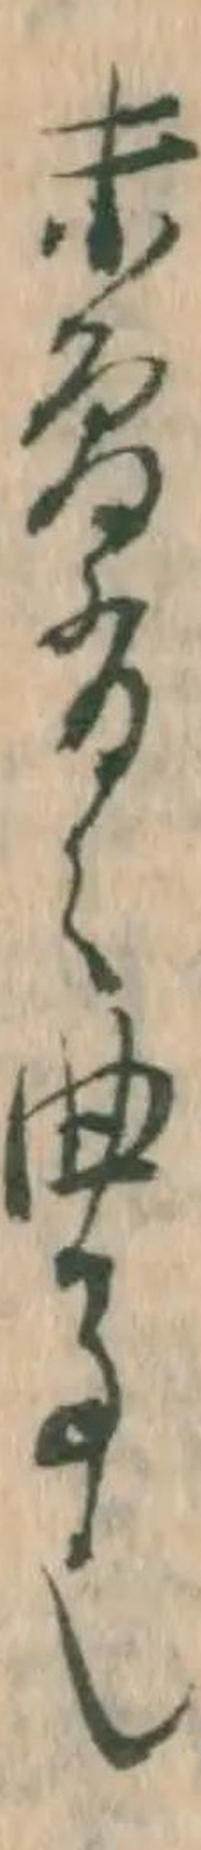未曾有之曲事也
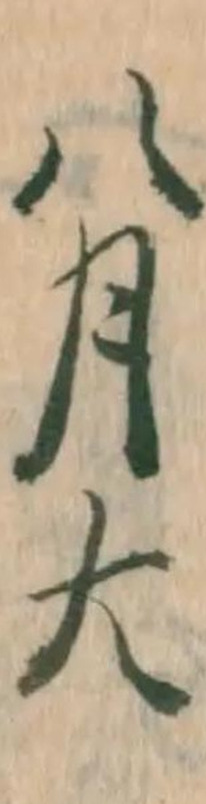八月大
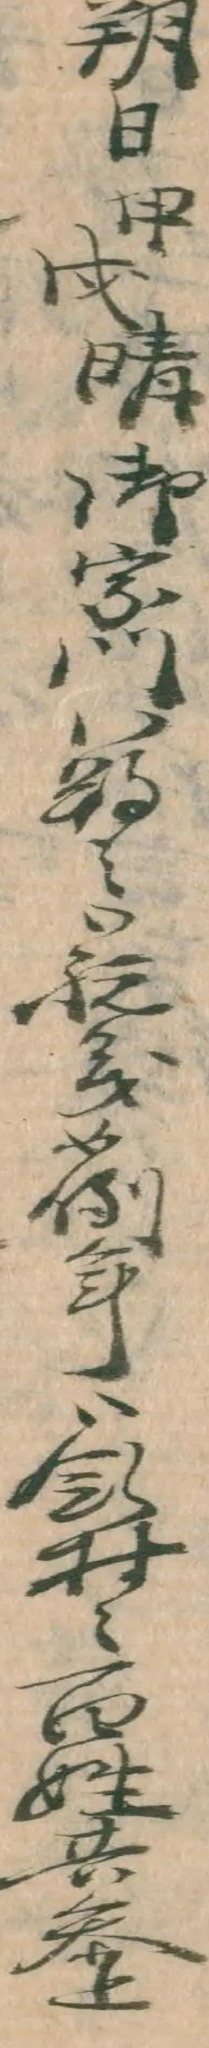朔日甲戌晴御家門八朔之御祝義如例年御領村之百姓共参上
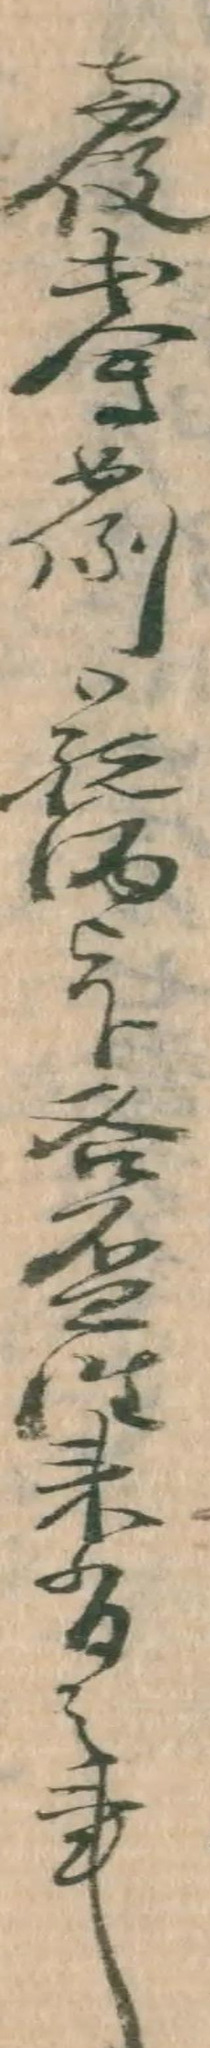両役等會如例御祝酒被下各盃往来有之事
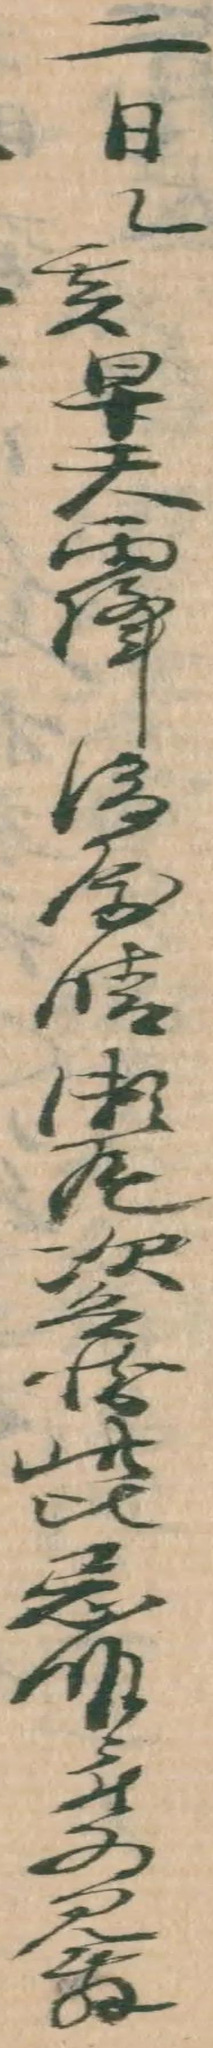二日乙亥早天雨降後属瀬尾次兵衛此比忌明ニ付為見舞
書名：賀茂社記録. 第65冊
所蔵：国立国会図書館 National Diet Library, JAPAN
